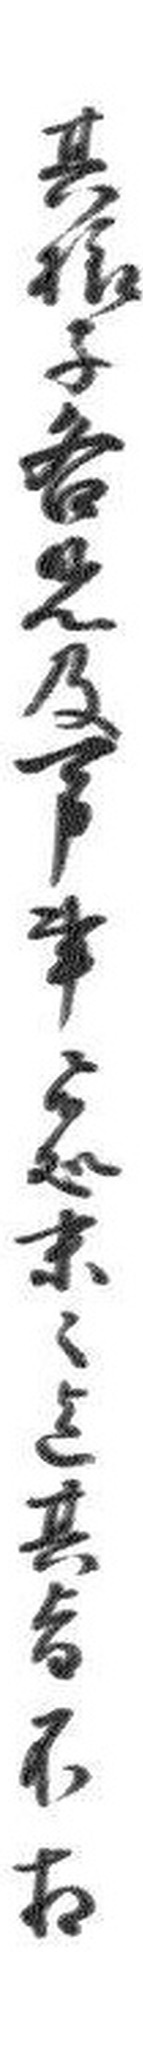其様子各見及可申事ニ候処末々迄其旨不相
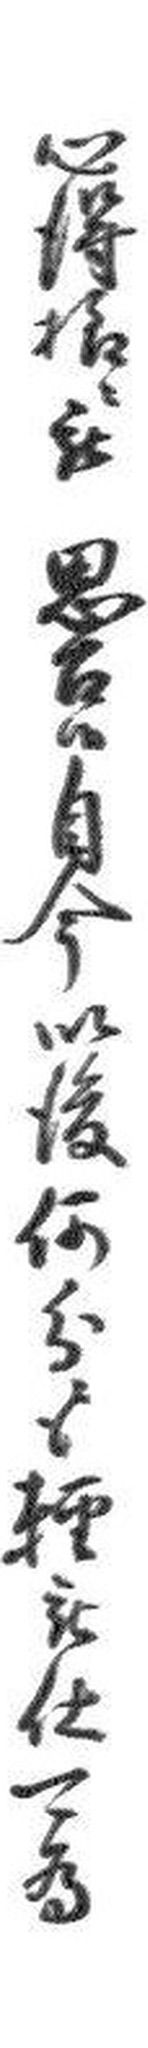心得様ニ被思召候自今以後何分ニも軽被仕可為
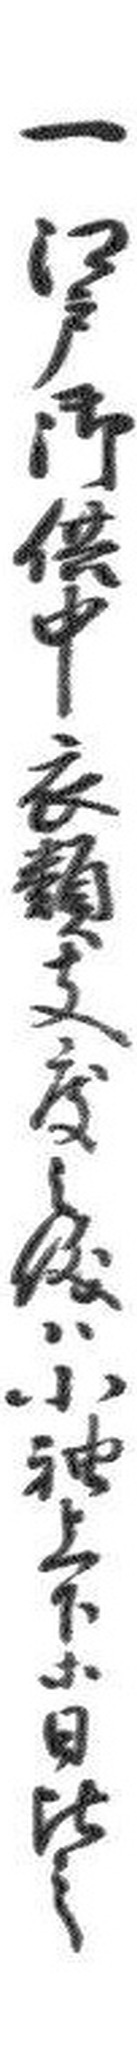一江戸御供中衣類支度之儀は小袖上下等日頃之
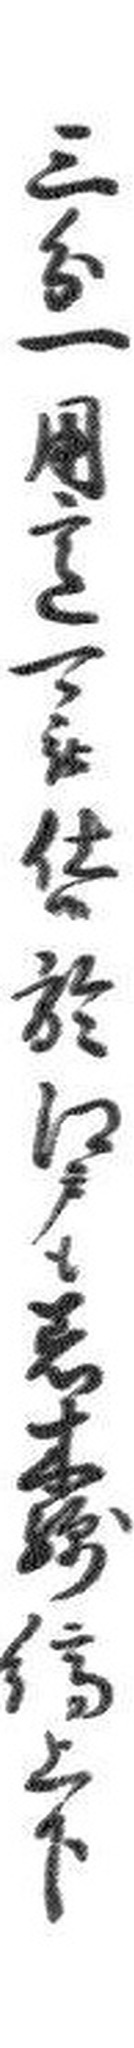三分一用意可被仕候於江戸も着木綿縞上下

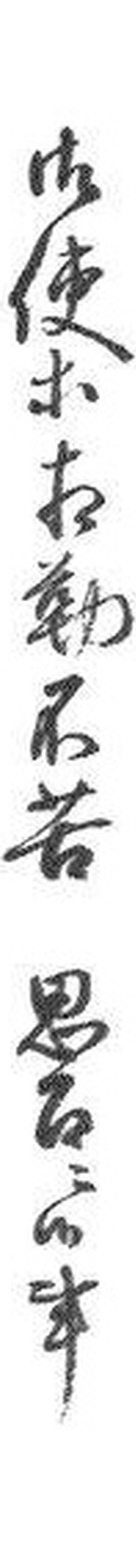御使等相勤不苦思召ニ候事
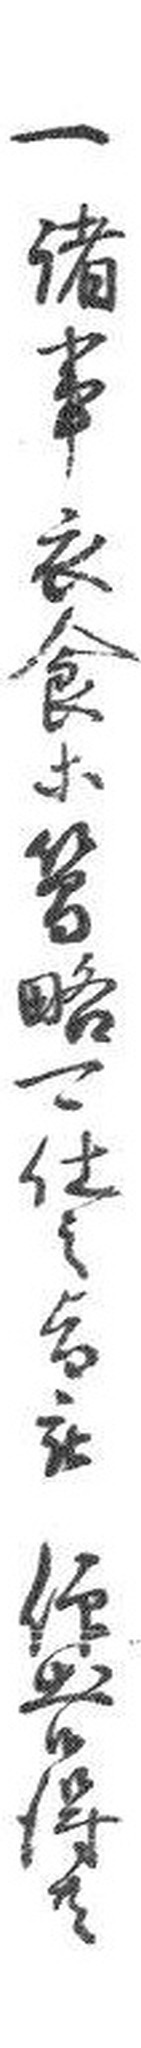一諸事衣食等簡略可仕之旨被仰出候得共
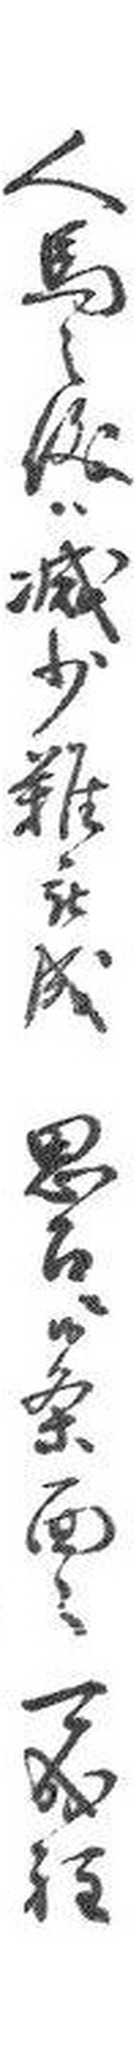人馬之儀は減少難被成思召ニ候条面々可成程
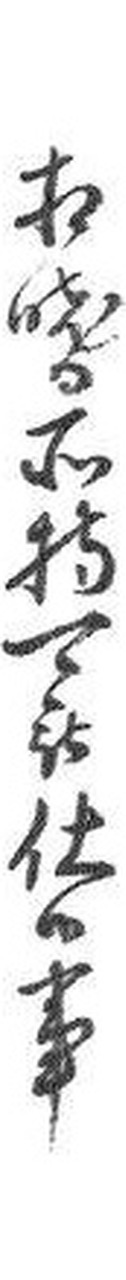相嗜所持可被仕候事
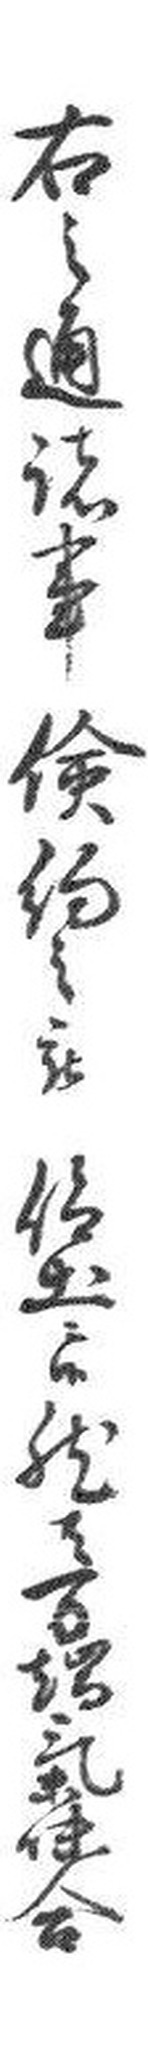右之通諸事倹約之被仰出ニ候然共万端気味合
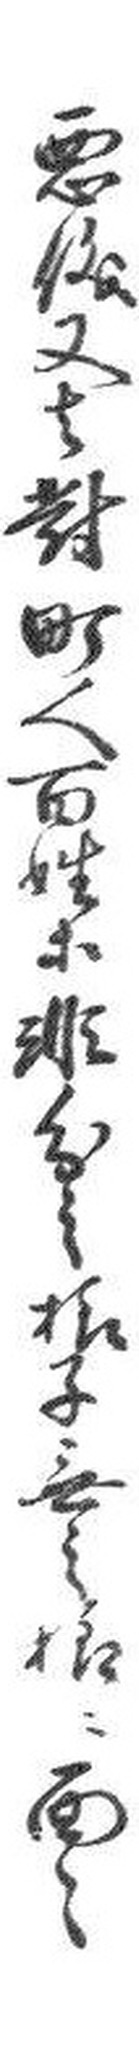悪儀又者対町人百姓等非分之様子無之様ニ面々
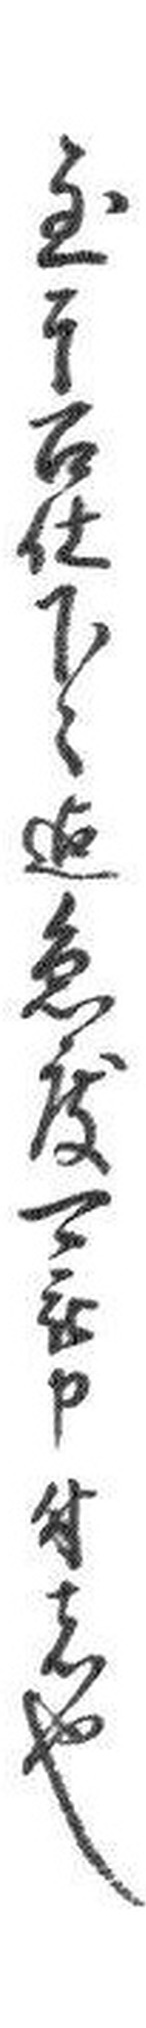至于召仕下々迄急度可被申付者也
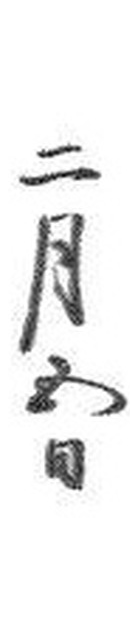二月五日
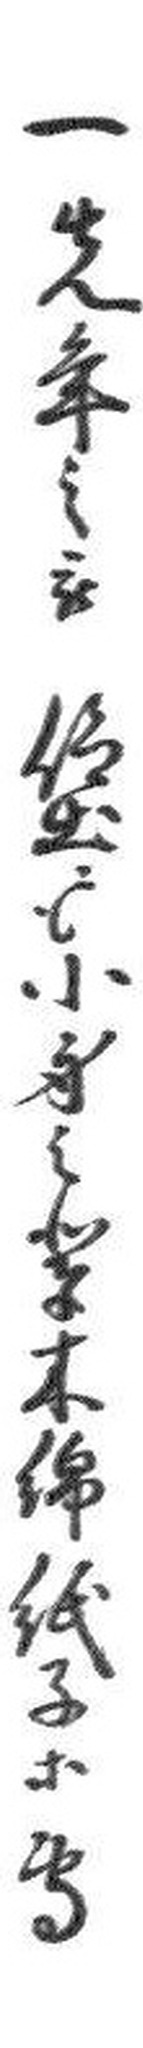一先年之被仰出ニも小身之輩木綿紙子等専
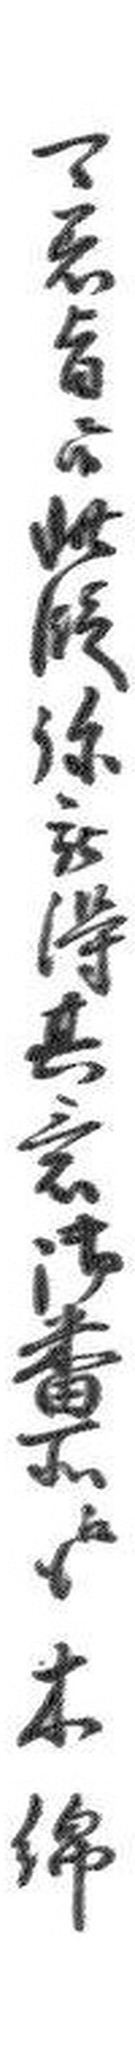可着旨ニ候此段弥被得其意御番所江も木綿
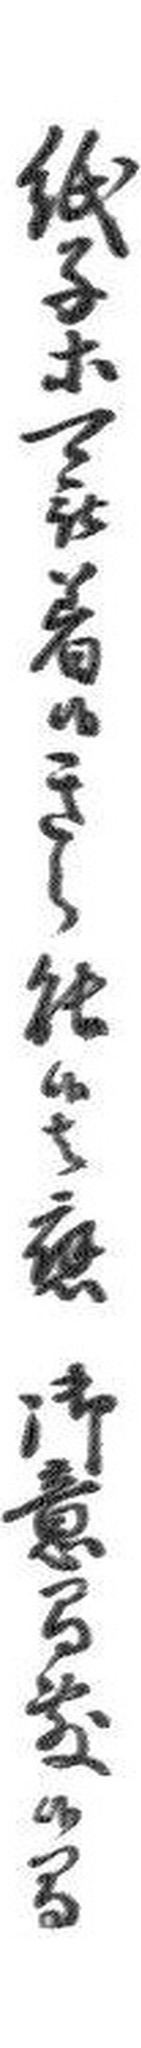紙子等可被着候きら能候者応御意間敷候間
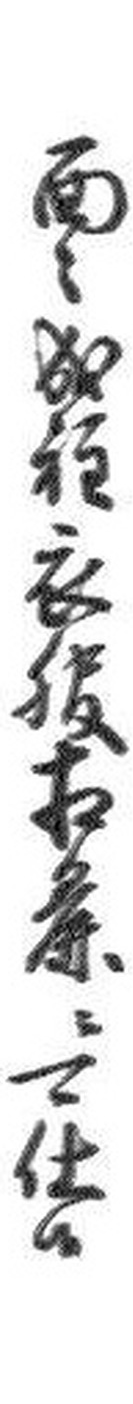面々成程衣服相麁ニ可仕候
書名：家譜 八 光通公 従寛文十年到同十二年
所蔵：福井県文書館 Fukui Prefectural Archives
